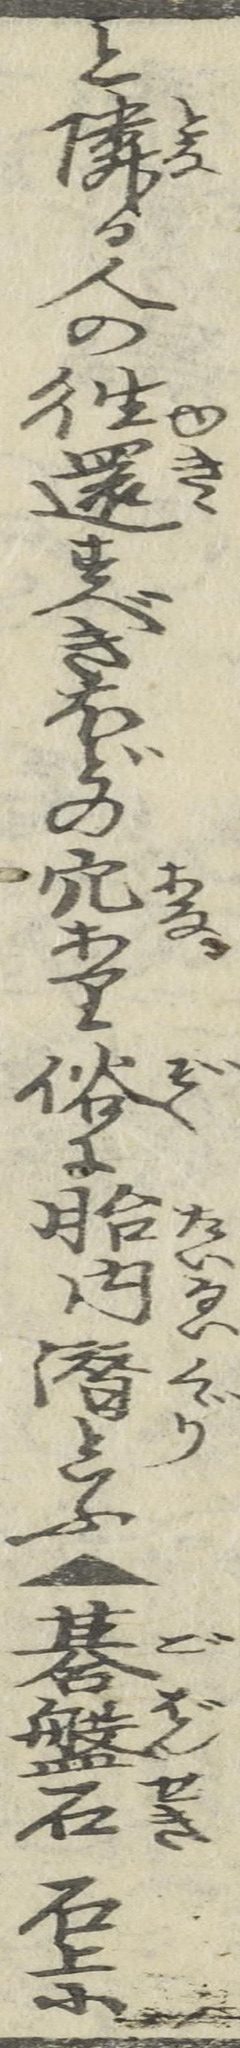と隣る人の往還すべきほど穴あり俗に胎内潜といふ▲碁盤石石上に
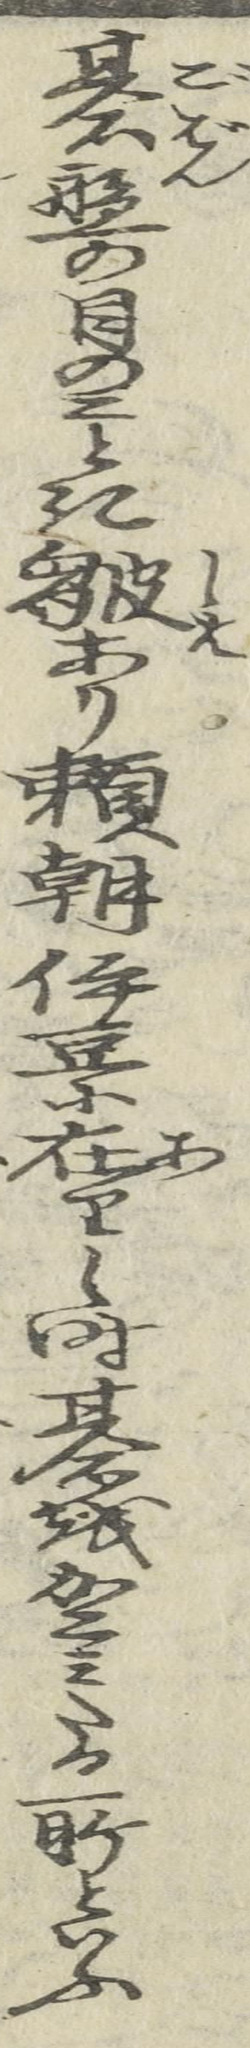碁盤の目のことき皺あり頼朝伊豆に在りし時碁をかこみたる所といふ
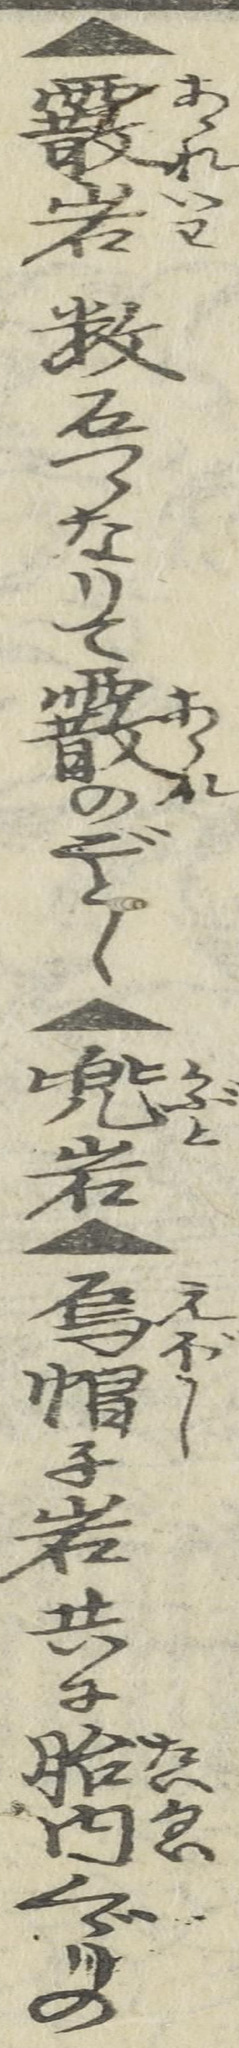▲霰岩数石つらなりて霰のごとし▲兜岩▲烏帽子岩共に胎内くゞりの
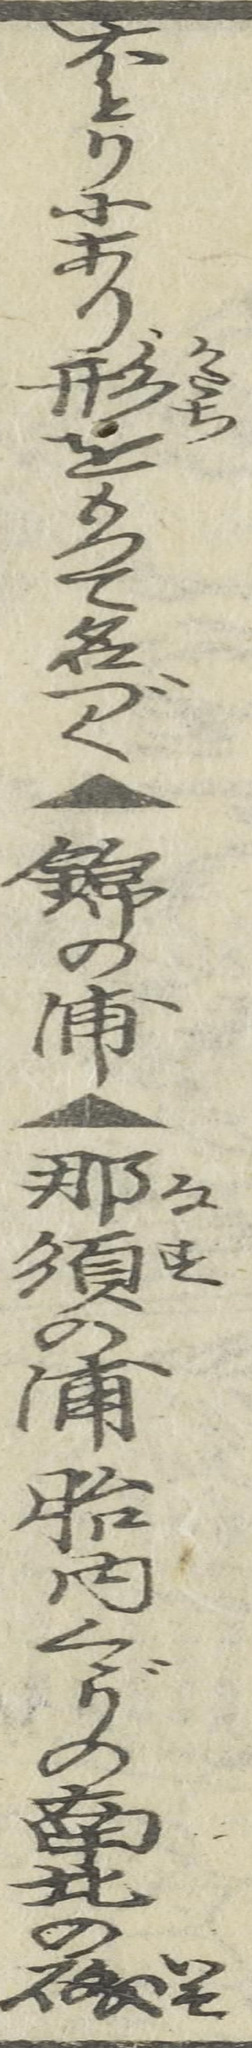ほとりにあり形をもつて名づく▲錦の浦▲那須の浦胎内くゞりの南北の磯
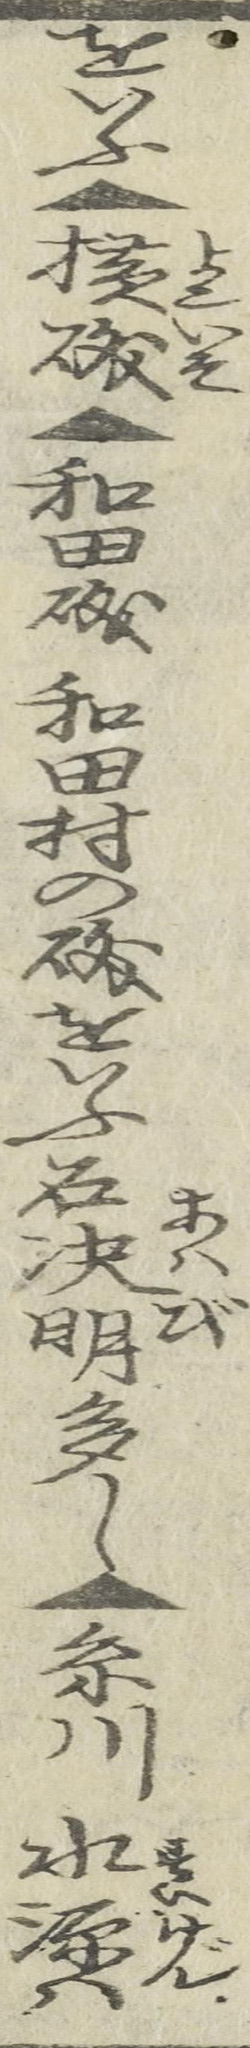をいふ▲横磯▲和田磯和田村の磯をいふ石決明多し▲糸川水源は
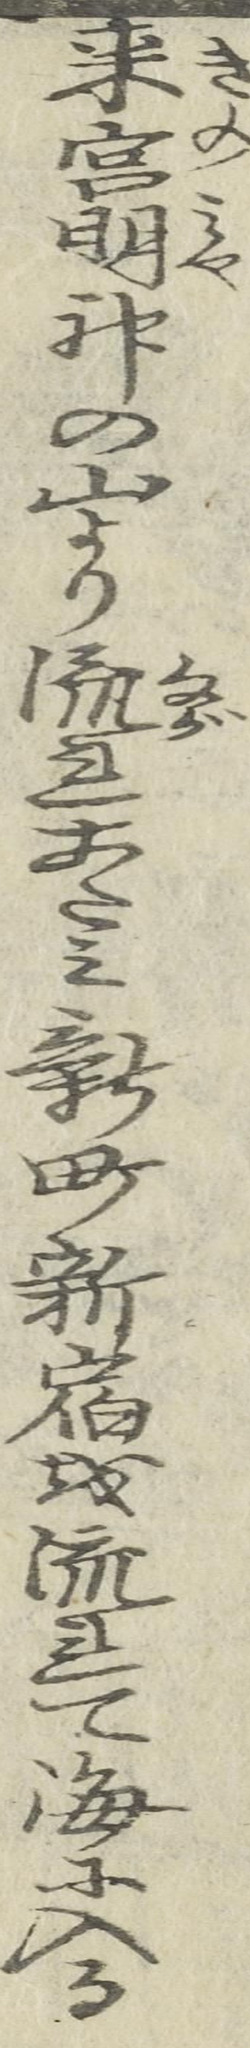来宮明神の山より流れあたみ新町新宿を流れて海に入る
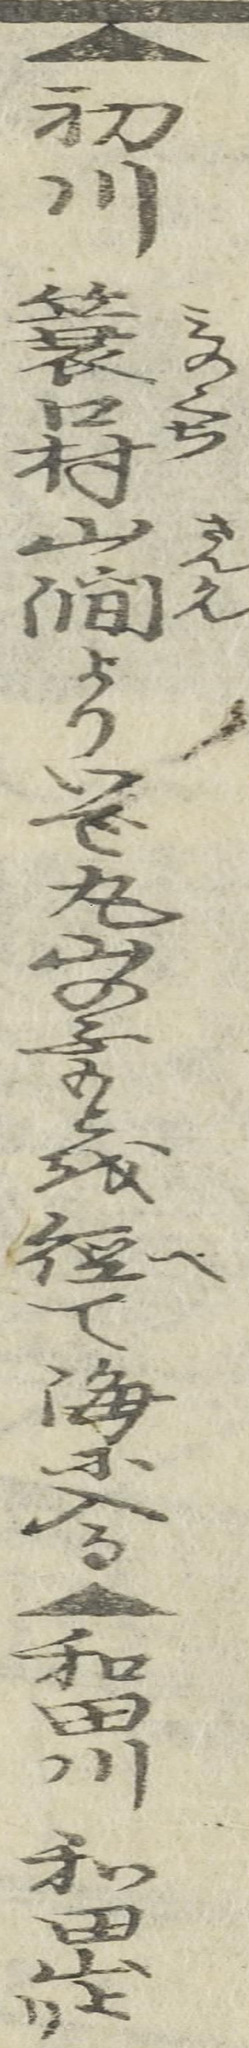▲初川蓑口村山間よりいで丸山のふもとを経て海に入る▲和田川和田山より
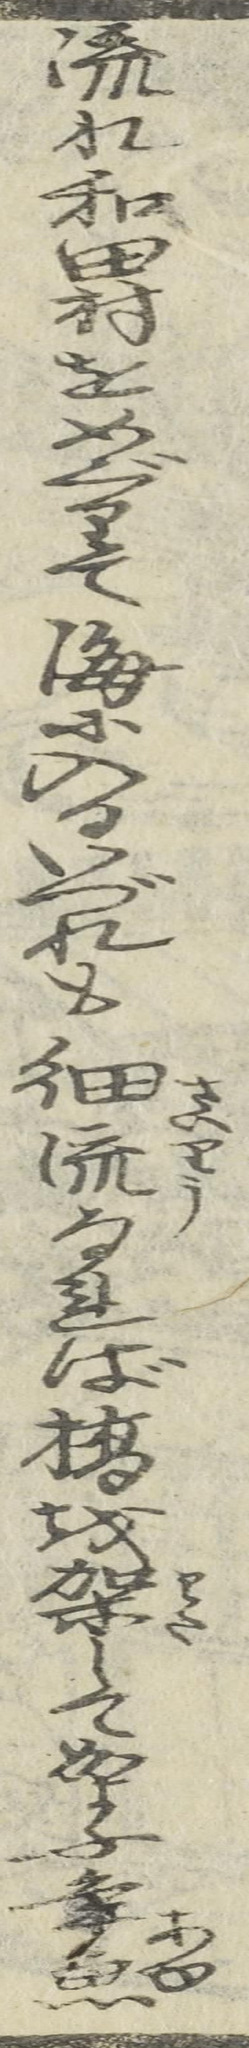流れ和田村をめぐりて海に入るいづれも細流なれば橋を架してかよふ香魚
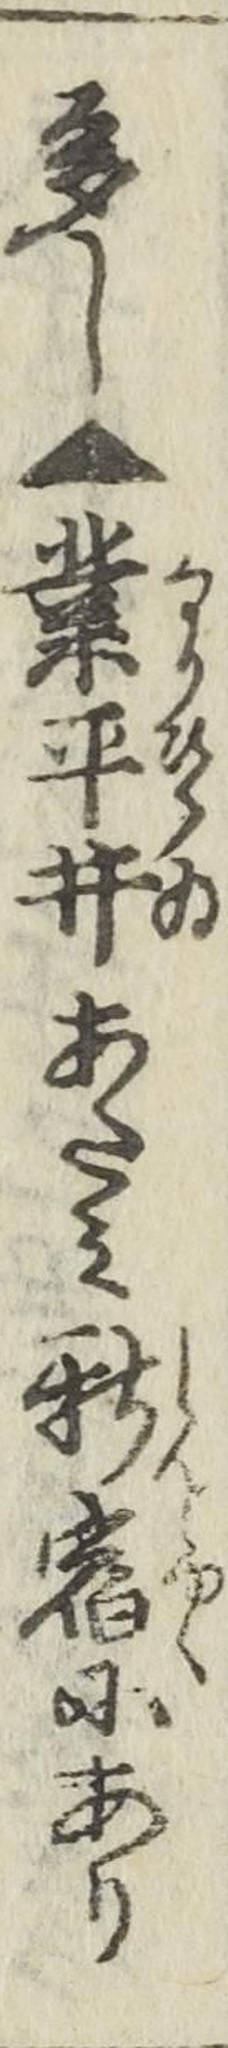多し▲業平井あたみ新宿にあり
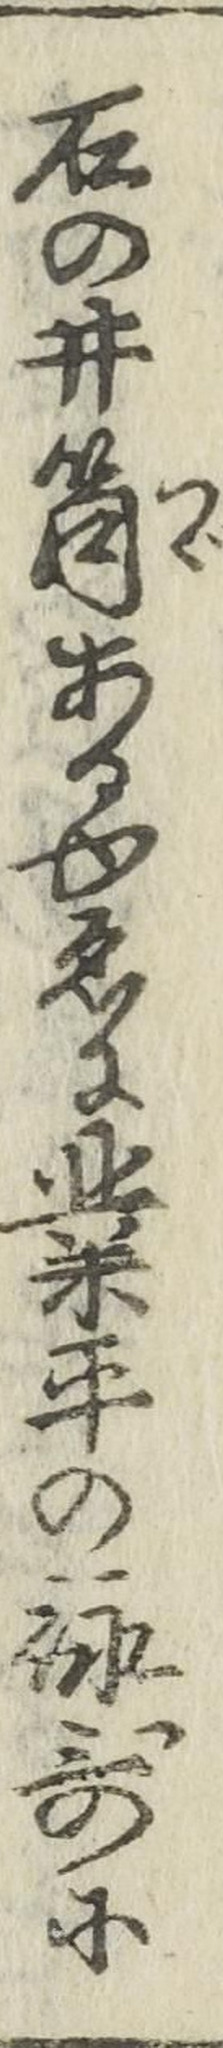石の井筒あるゆゑに業平の詠歌に
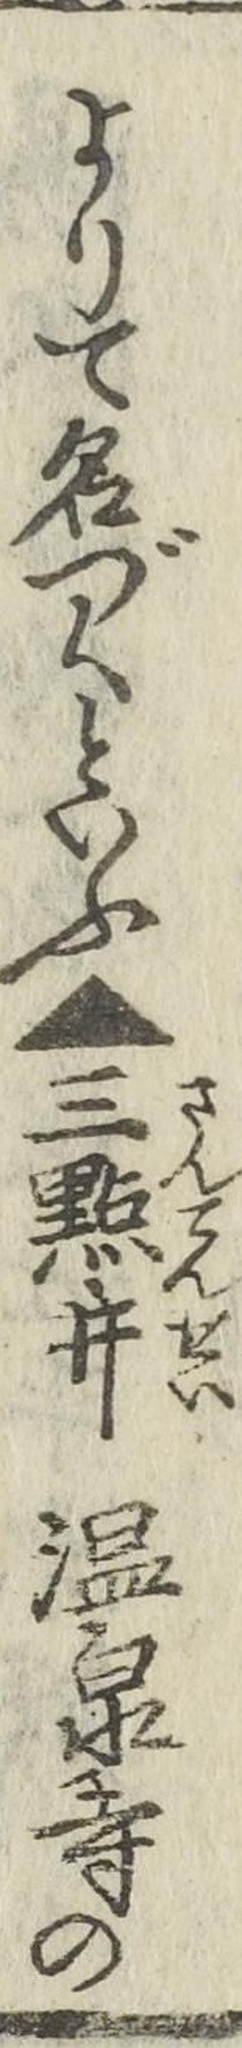よりて名づくといふ▲三点井温泉寺の
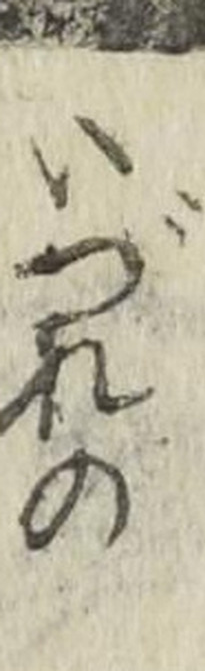いづれの
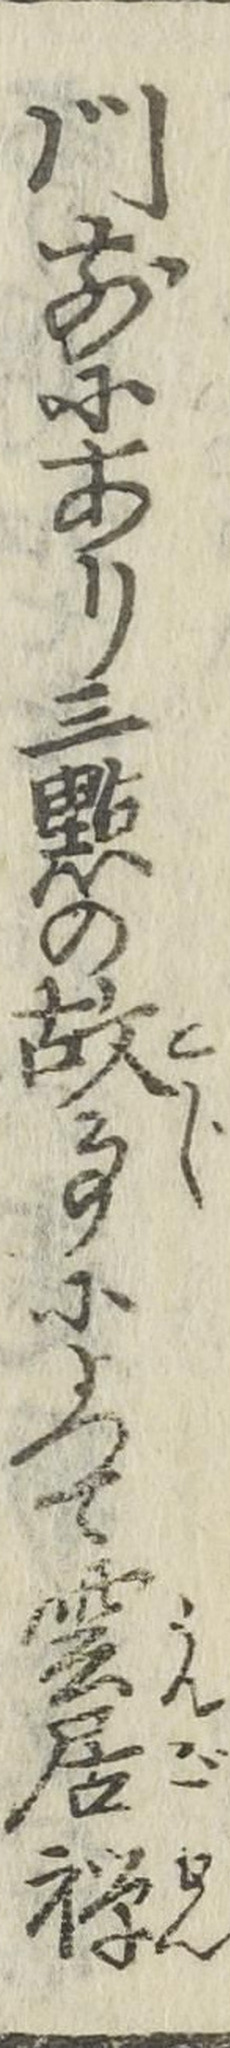門前にあり三点の故事によつて雲居禅
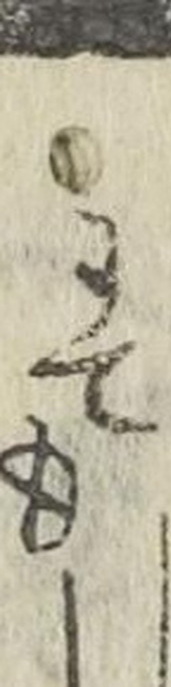にても
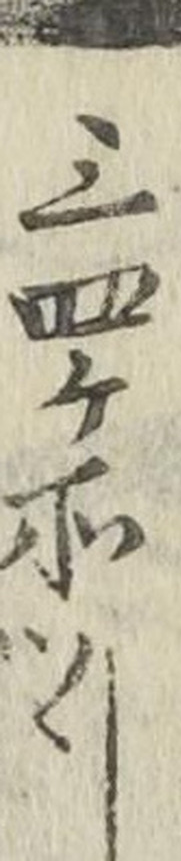三四ヶ所つゝ
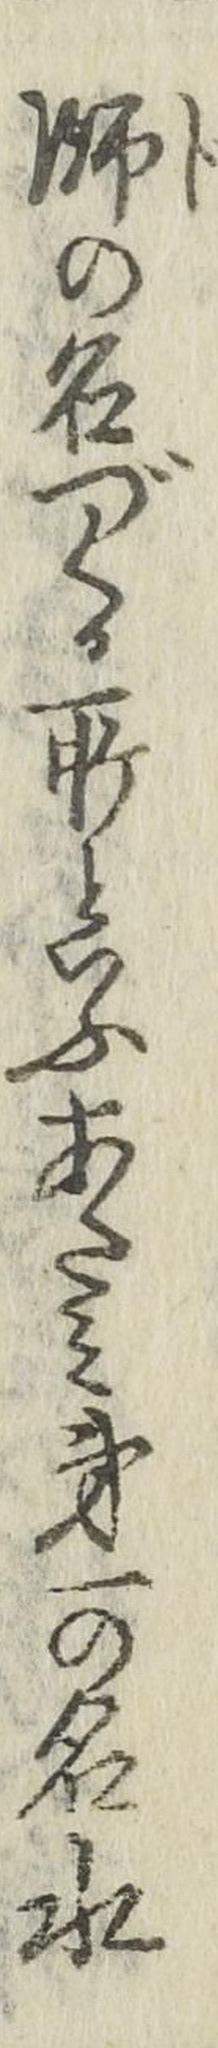師の名づくる所といふあたみ第一の名水
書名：熱海温泉圖彙
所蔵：東京大学地震研究所図書室 Earthquake Research Institute Library, The University of Tokyo, JAPAN
